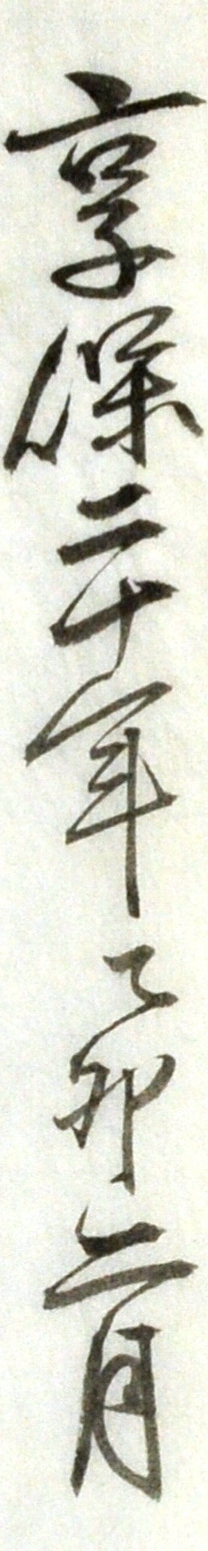享保二十年乙卯二月
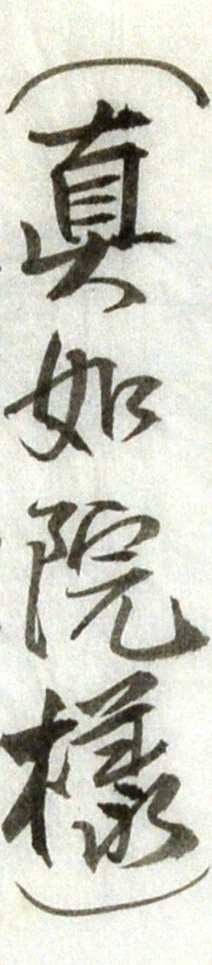真如院様
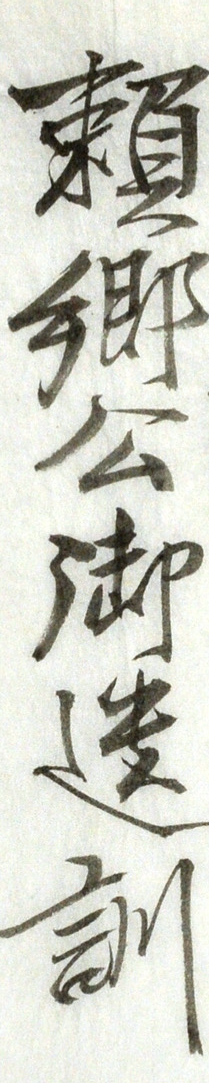頼郷公御遺訓

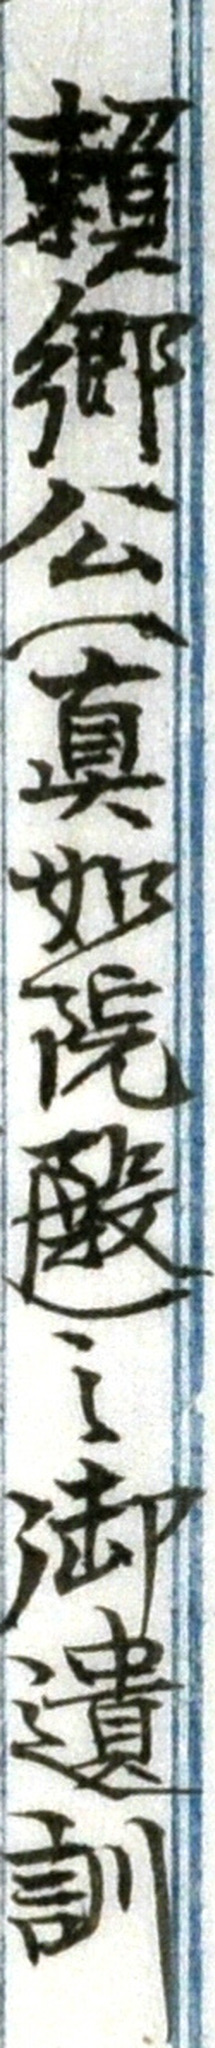頼郷公(真如院殿)之御遺訓
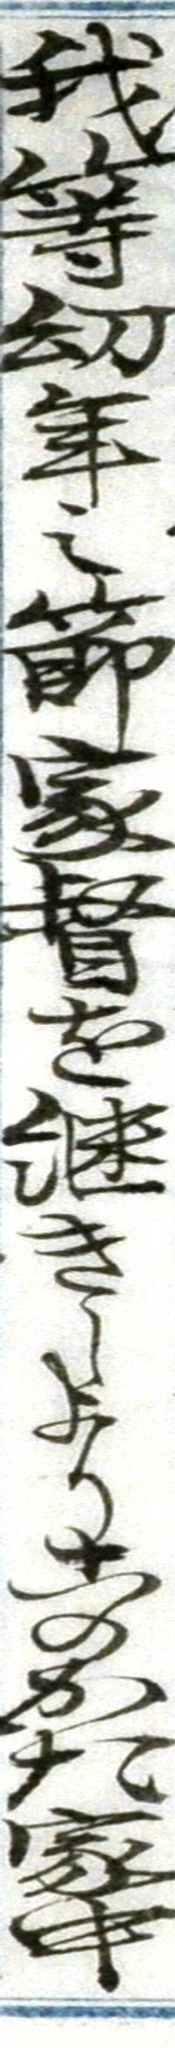我等幼年之節家督を継きしよりこのかた家中
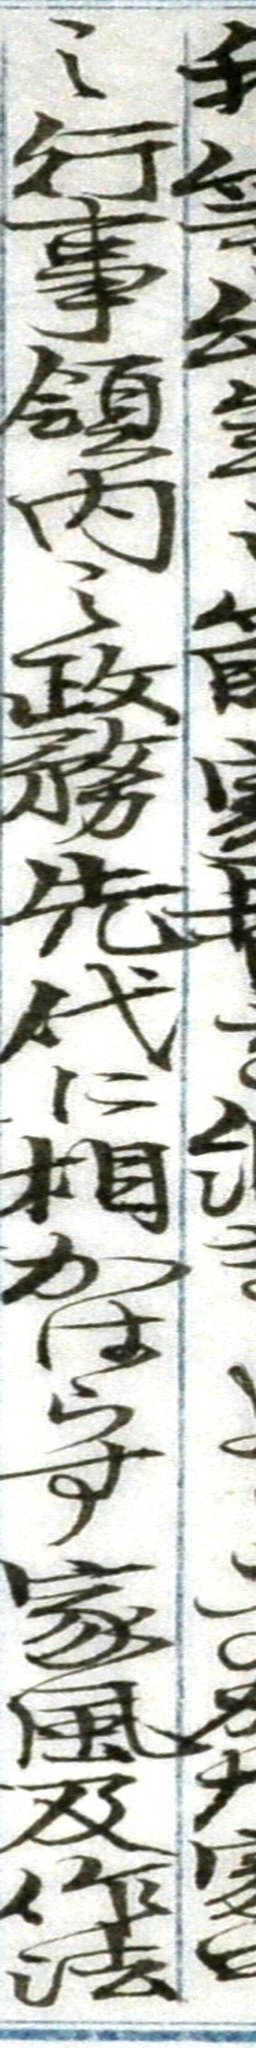之行事領内之政務先代に相かはらず家風及作法
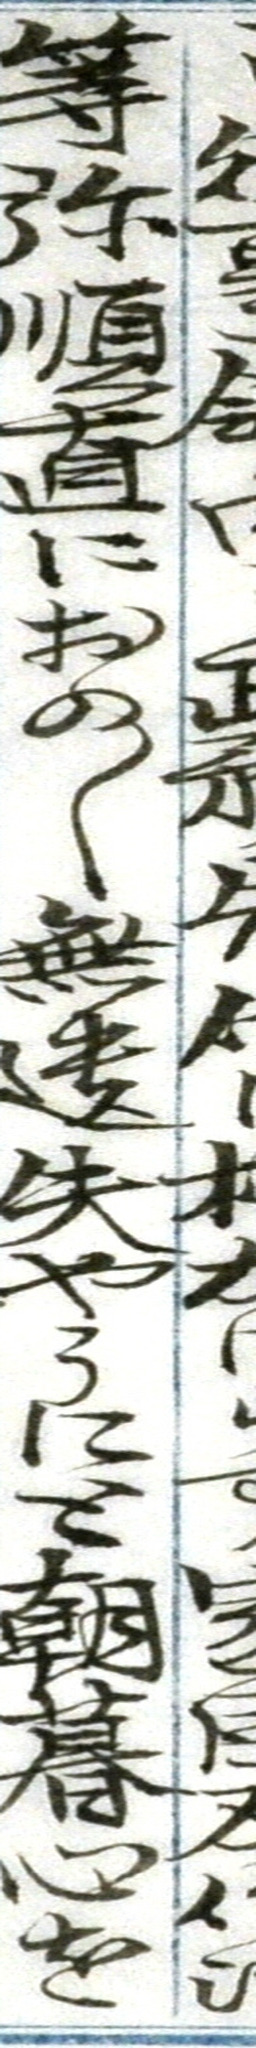等弥順直におの〳〵無遺失やうにと朝暮心を
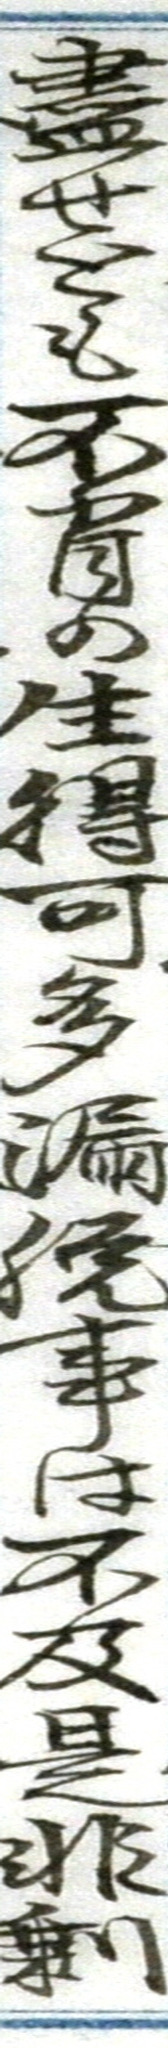尽せとも不肖の生得可多漏脱事は不及是非剰
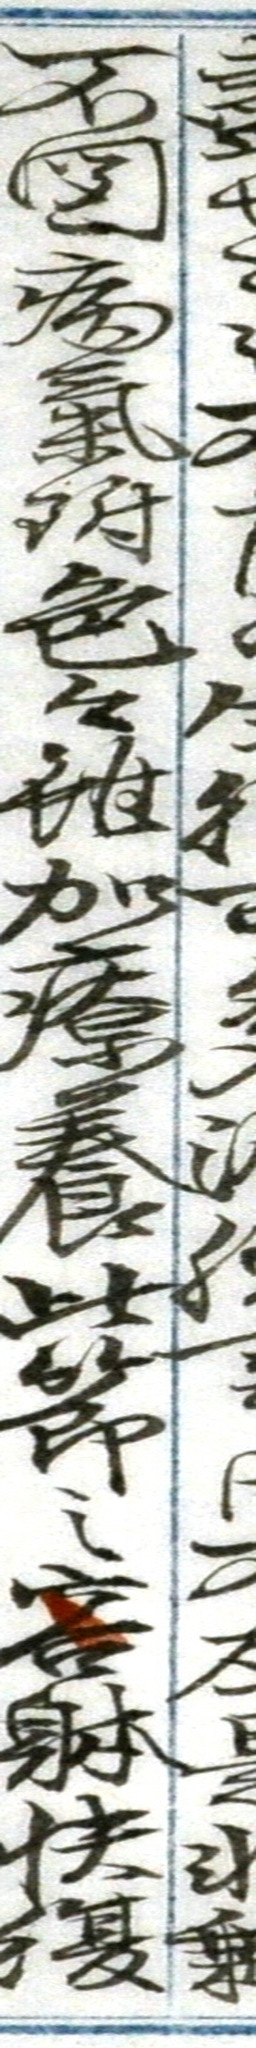不図病気附色々雖加療養此節之容体快復
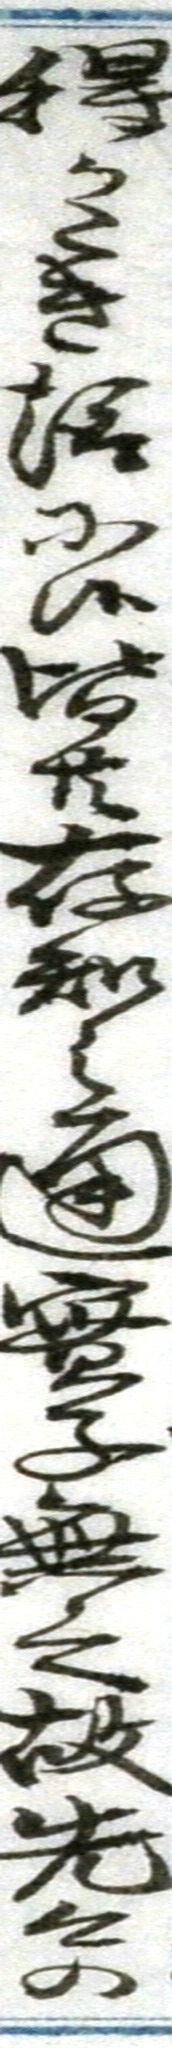得かたき趣に候皆共存知之通実子無之故先々の
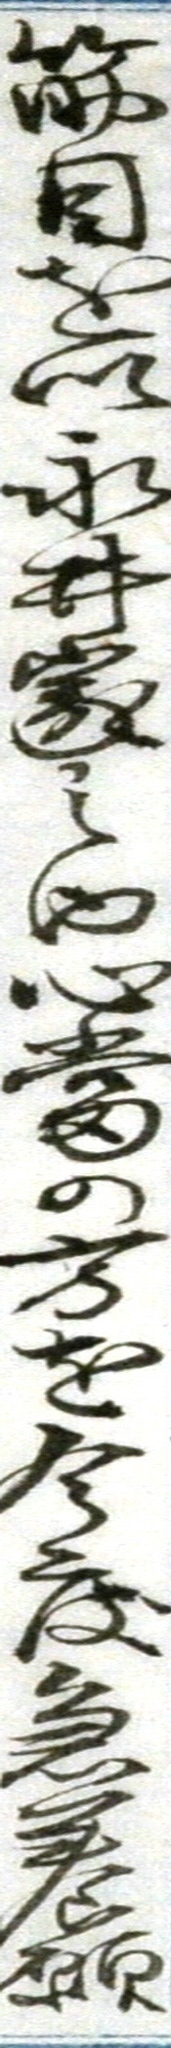筋目を以永井家之内心当の方を今度急養願
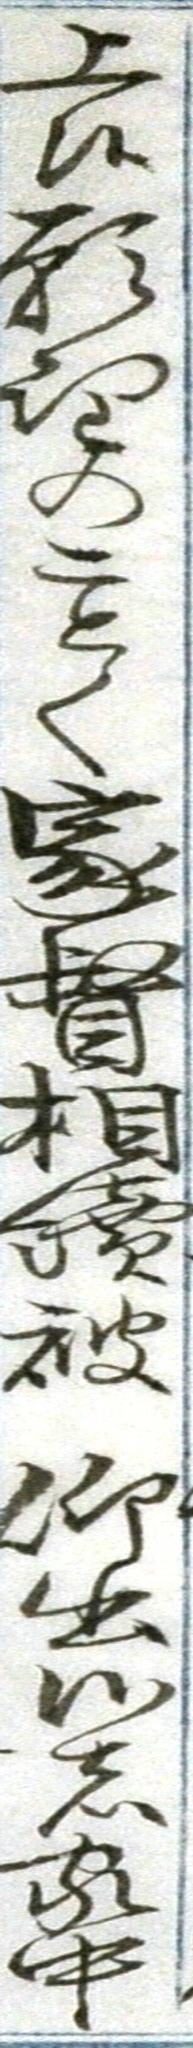上候願望のことく家督相続被仰出候者家中
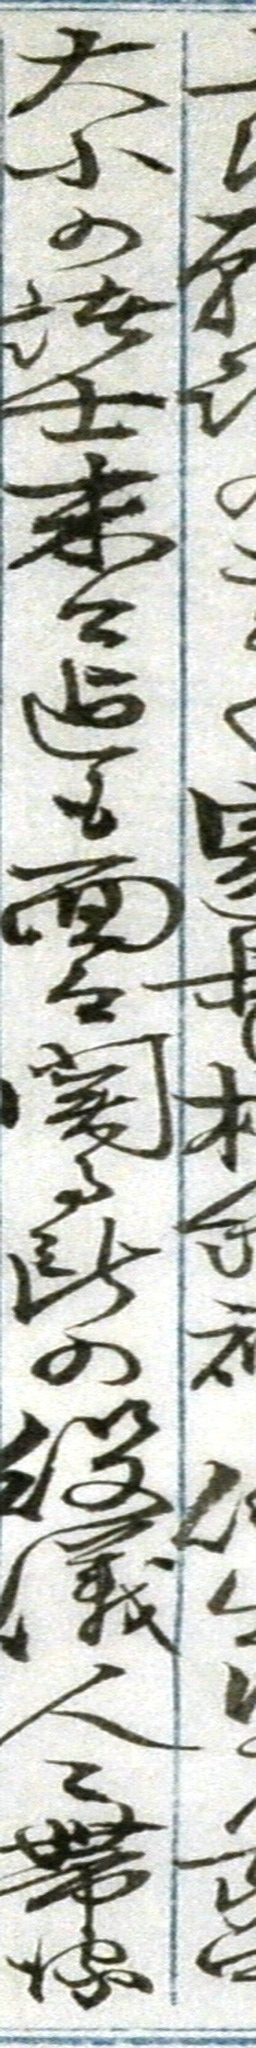大小の諸士末々迄も面々関る所の役儀人々帯る
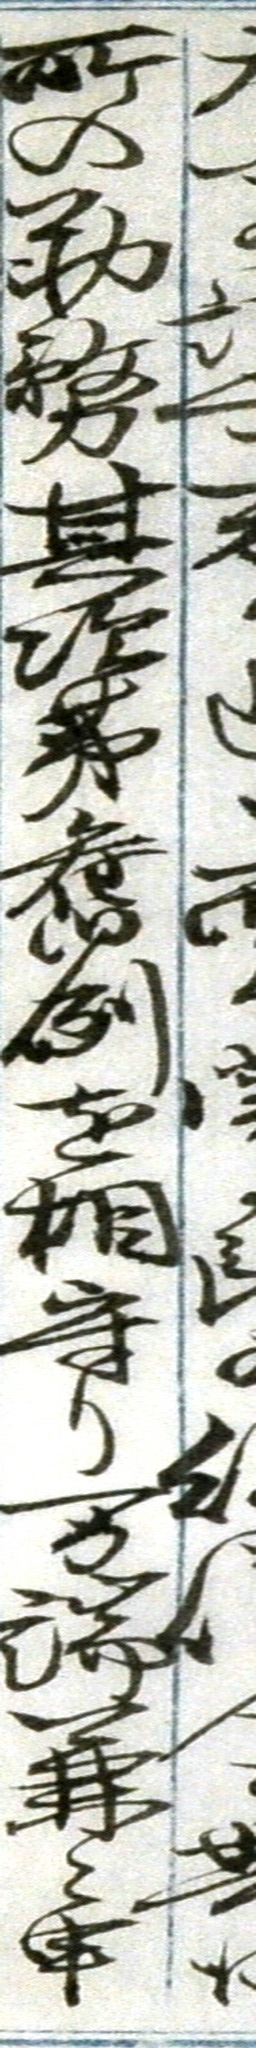所の勤務其次第旧例を相守り万端兼々申
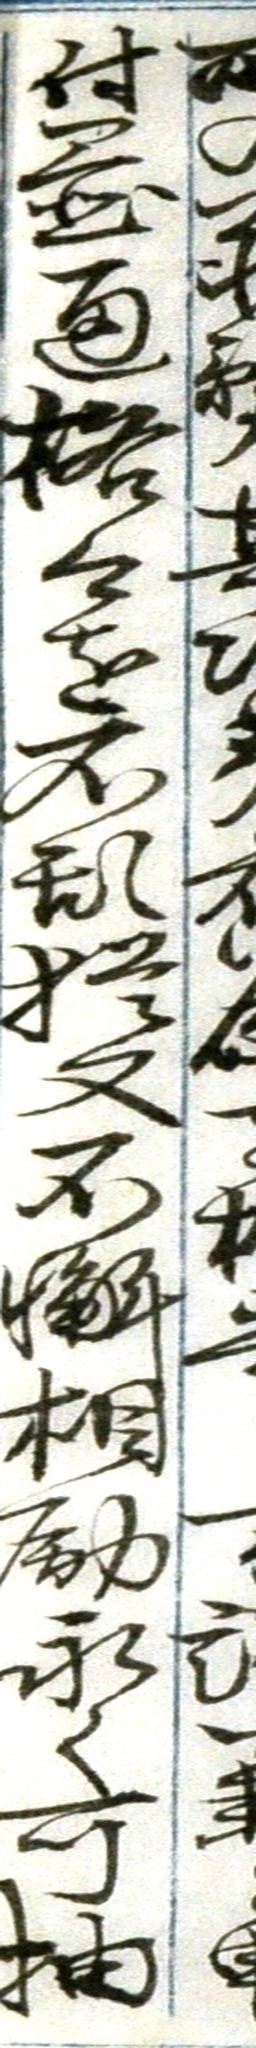付置通格々を不乱猶又不懈相励永く可抽

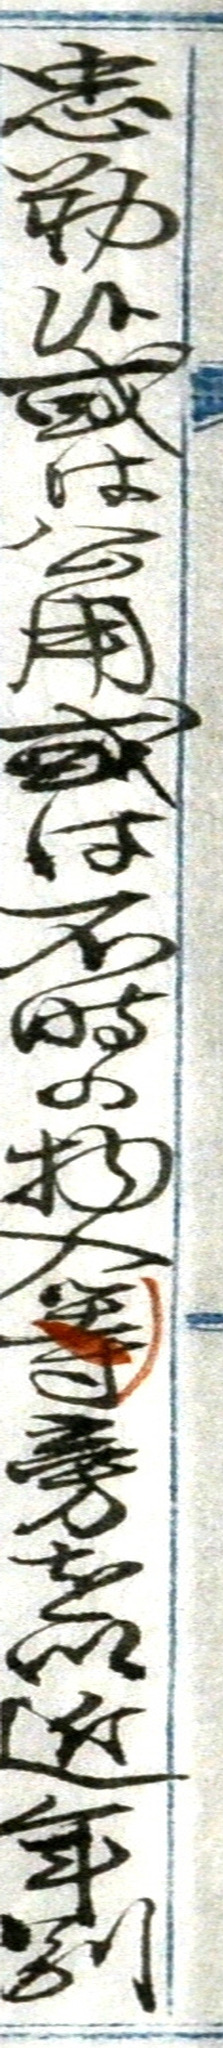忠勤候或は公用或は不時の物入等旁を以近年別
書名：頼卿公（真如院様）御遺訓
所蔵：伊那市立高遠町図書館・合同会社AMANE
